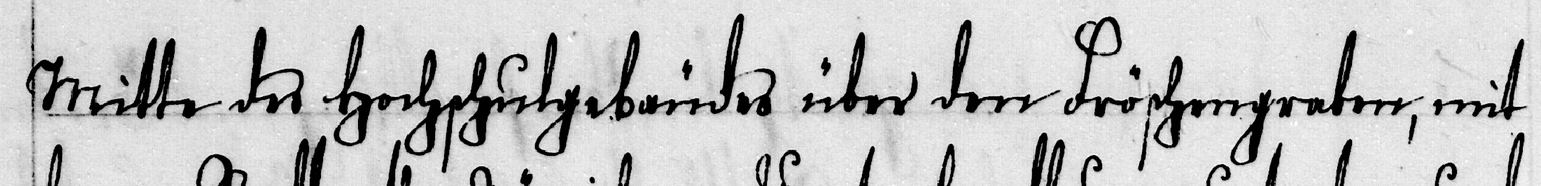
Mitte des Hochschulgebäudes über den Fröschengraben, mit
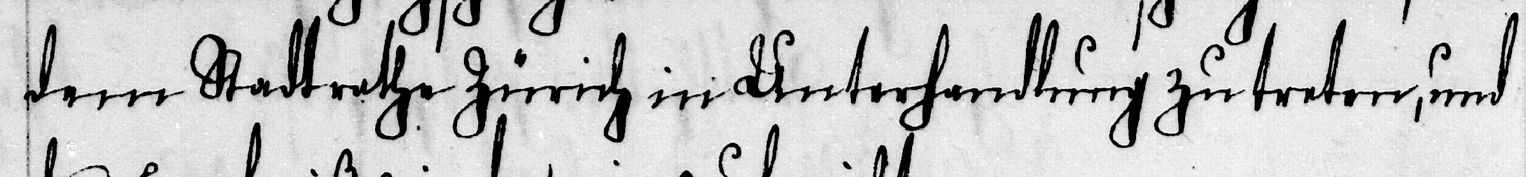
dem Stadtrathe Zürich in Unterhandlung zu treten, und
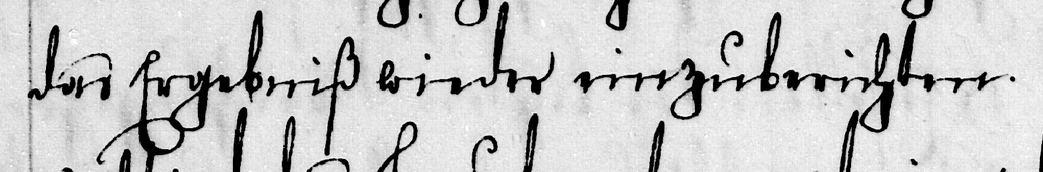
das Ergebniß wieder einzuberichten.
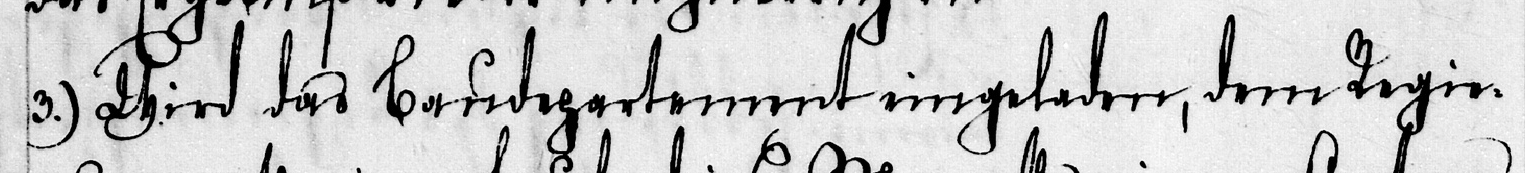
3.) Wird das Baudepartement eingeladen, dem Regie¬
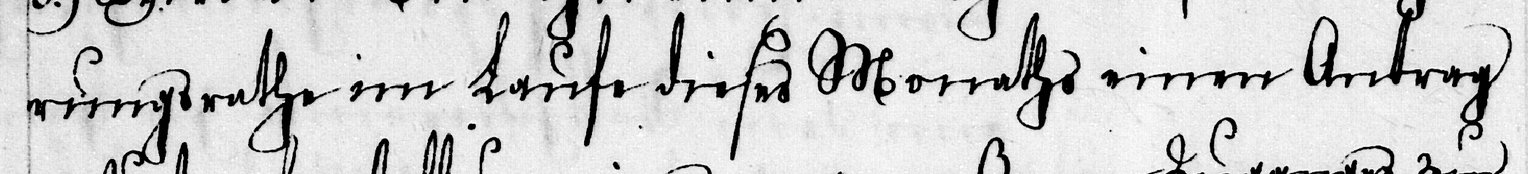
rungsrathe im Laufe dieses Monaths einen Antrag
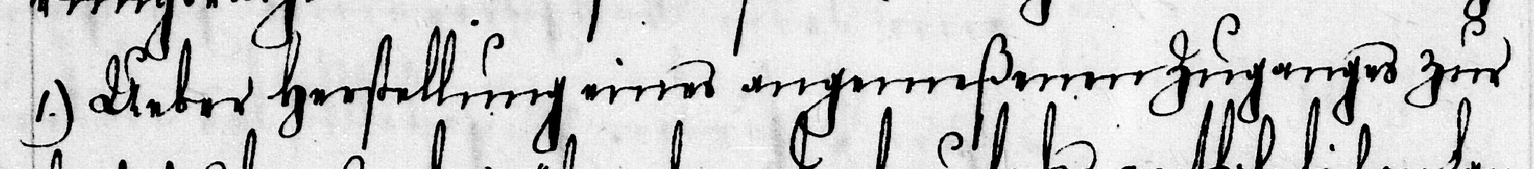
1.) Ueber Herstellung eines angemeßenen Zuganges zur
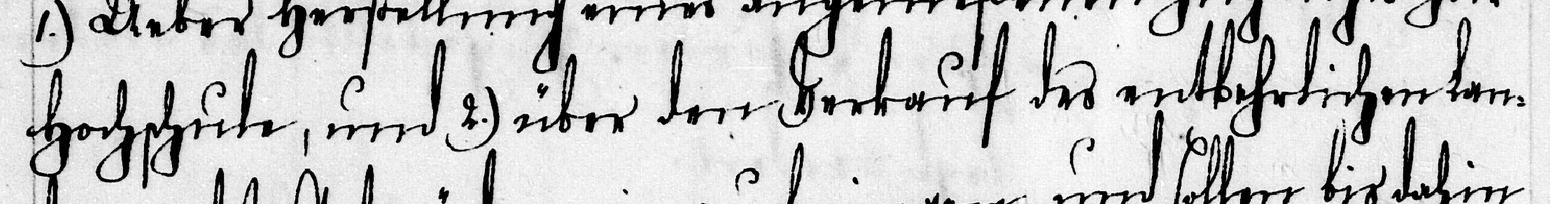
Hochschule, und 2.) über den Verkauf des entbehrlichen La¬
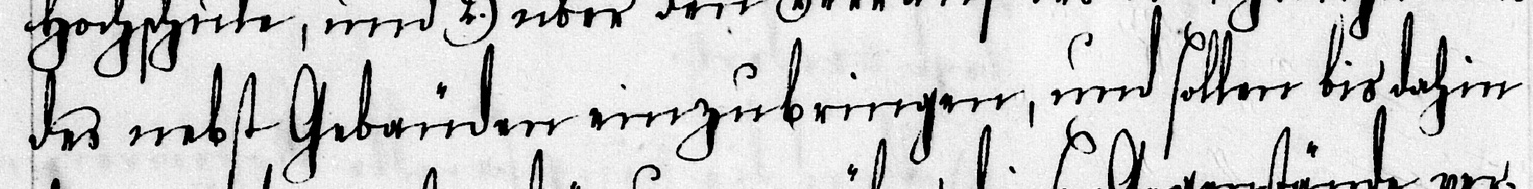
ndes nebst Gebäuden einzubringen, und sollen bis dahin
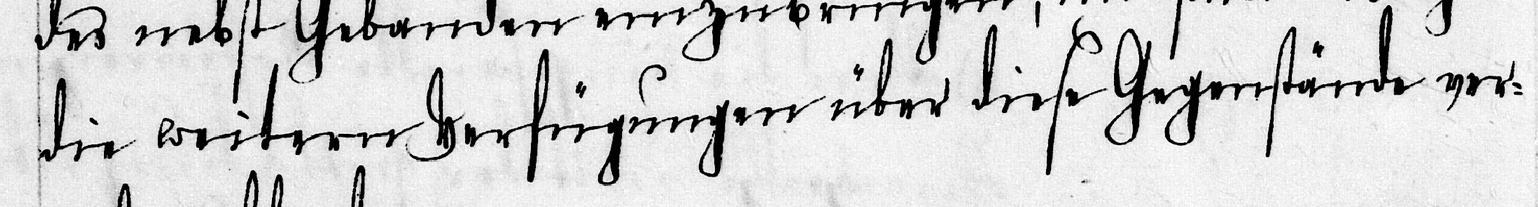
die weitern Verfügungen über diese Gegenstände ver¬
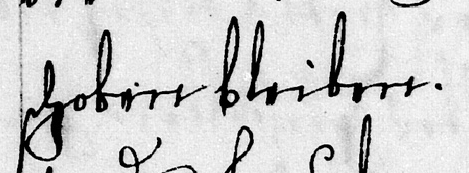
schoben bleiben.
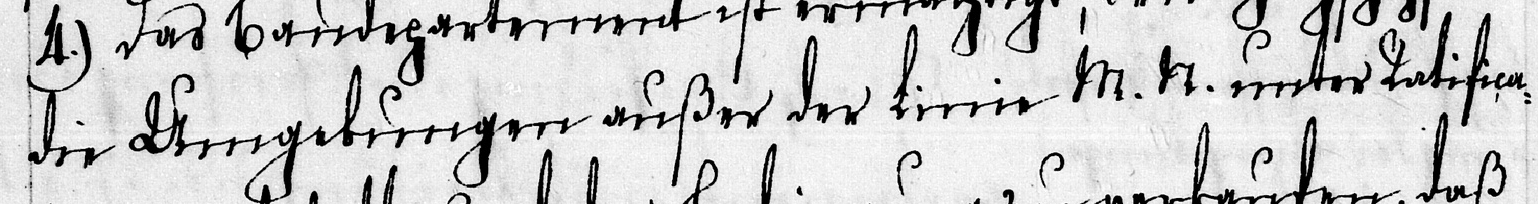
die Umgebungen außer der Linie M. N. unter Ratific¬
